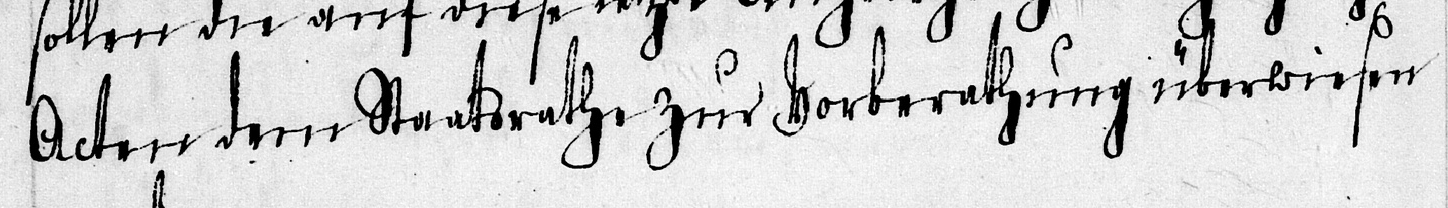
Acten dem Staatsrathe zur Vorberathung überwiesen
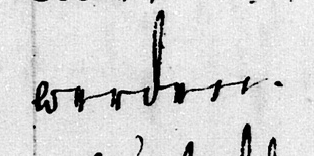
werden.
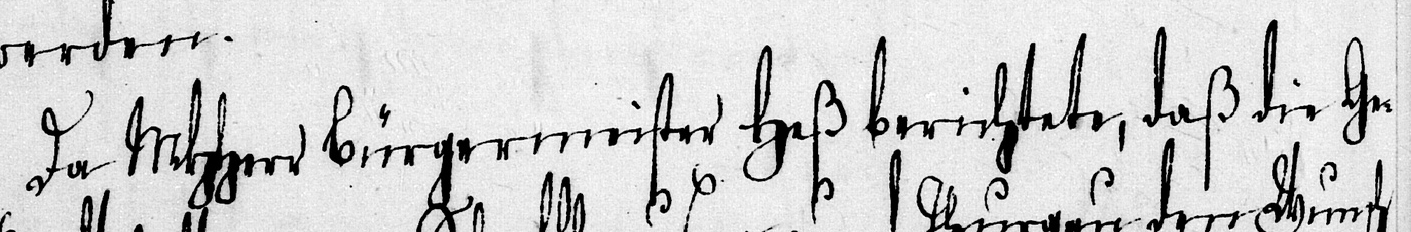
Da MHHerr Bürgermeister Heß berichtete, daß die G¬
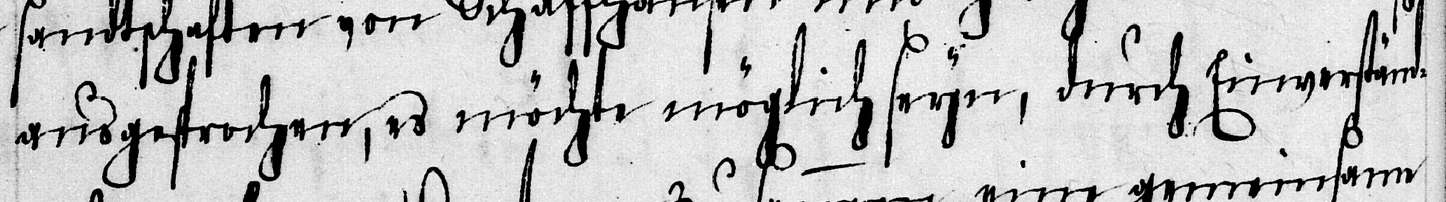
ausgesprochen, es möchte möglich seyn, durch Einverstän¬
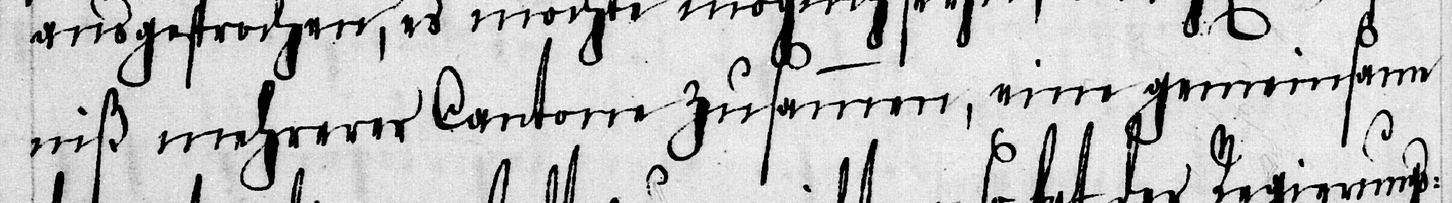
dniß mehrerer Cantone zusammen, eine gemeinsame
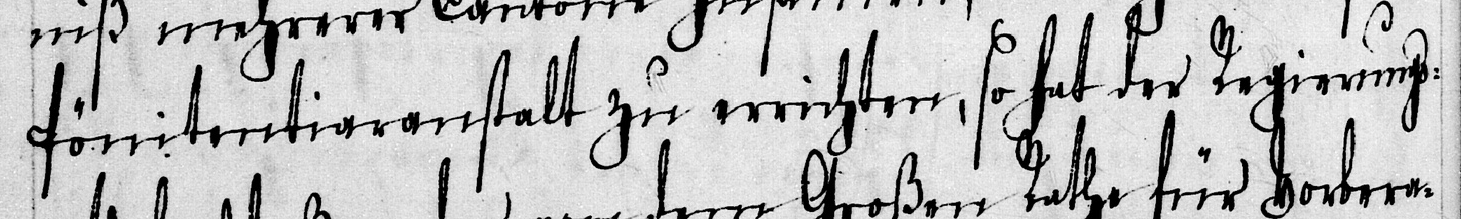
Pönitentiaranstalt zu errichten, so hat der Regierungs¬
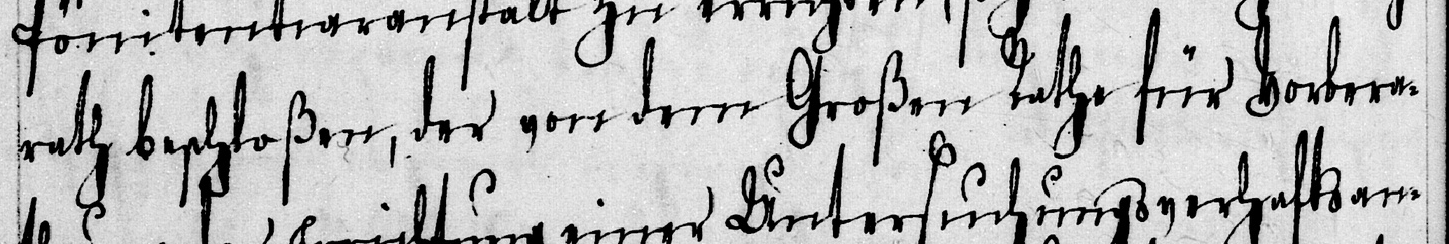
rath beschloßen, der von dem Großen Rathe für Vorbera¬
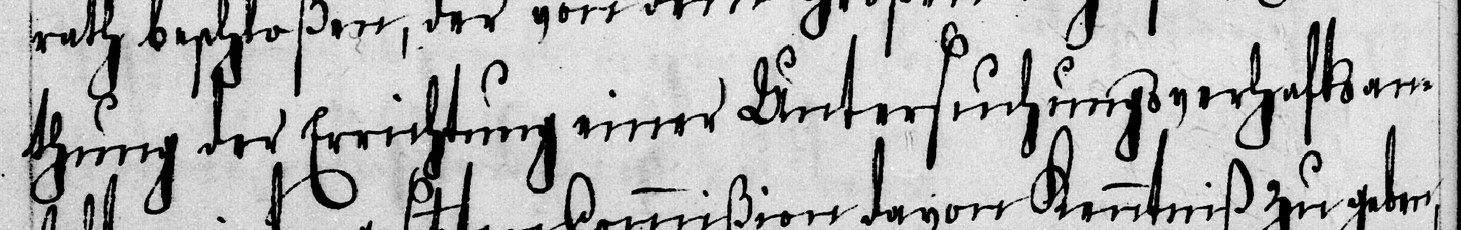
thung der Errichtung einer Untersuchungsverhaftsans¬
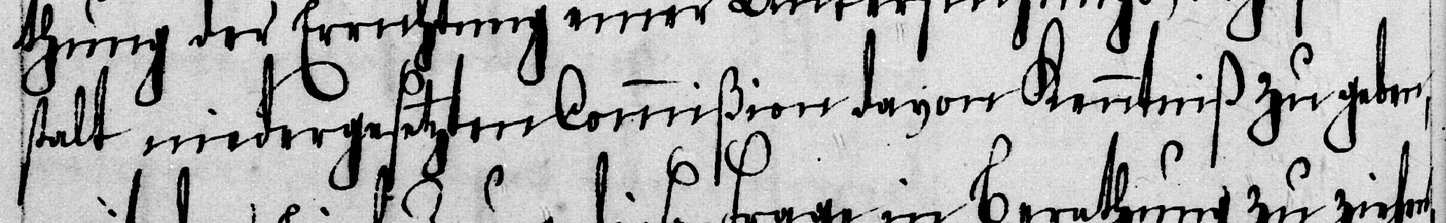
talt niedergesetzten Commißion davon Kenntniß zu gebe¬
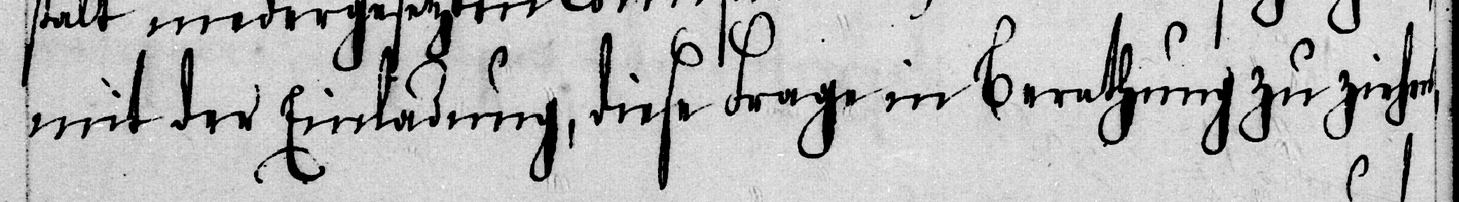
mit der Einladung, diese Frage in Berathung zu ziehen
